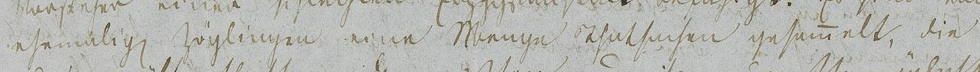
ehemaligen Zöglingen eine Menge Thatsachen gesammelt, die
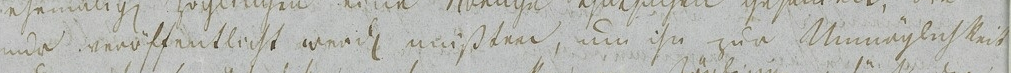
nur veröffentlicht werden müßten, um ihn zur Unmöglichkeit
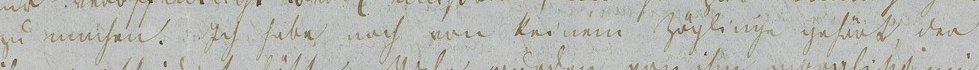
zu machen. Ich habe noch von keinem Zöglinge gehört, der
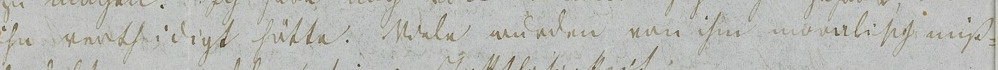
ihn vertheidigt hätte. Viele wurden von ihm moralisch miß-
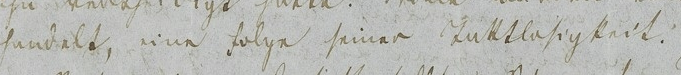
handelt, eine Folge seiner Taktlosigkeit. -
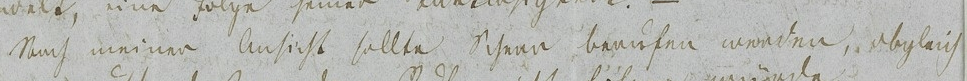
Nach meiner Ansicht sollte Scherr berufen werden, obgleich
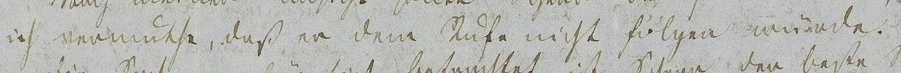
ich vermuthe, daß er dem Rufe nicht folgen würde.
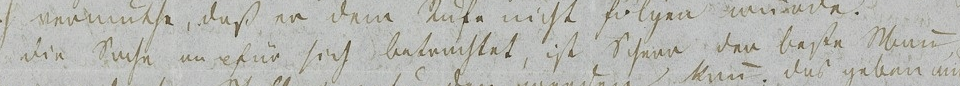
Die Sache an & für sich betrachtet, ist Scherr der beste Mann,
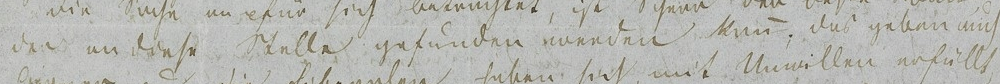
der an diese Stelle gefunden werden kann; das geben auch
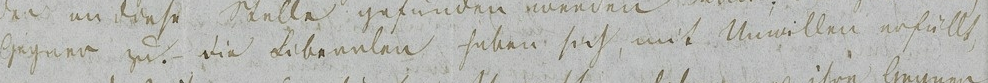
Gegner zu. Die Liberalen haben sich, mit Unwillen erfüllt,
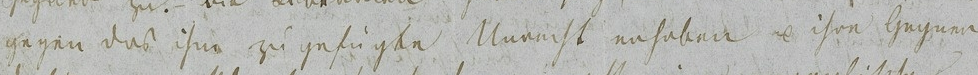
gegen das ihm zu gefügte Unrecht erhoben & ihre Gegner
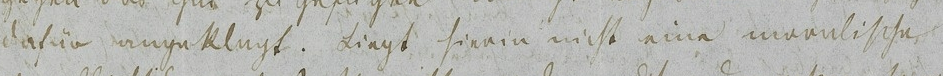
dafür angeklagt. Liegt hierin nicht eine moralische
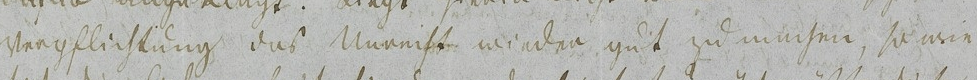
Verpflichtung das Unrecht wieder gut zu machen, so wie
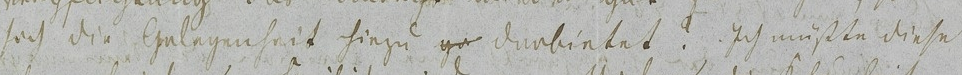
sich die Gelegenheit hiezu ga darbietet? Ich müßte diese
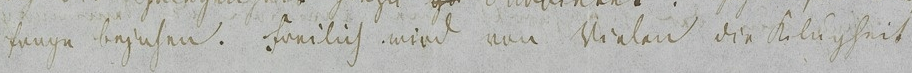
Frage bejahen. Freilich wird von Vielen die Klugheit
